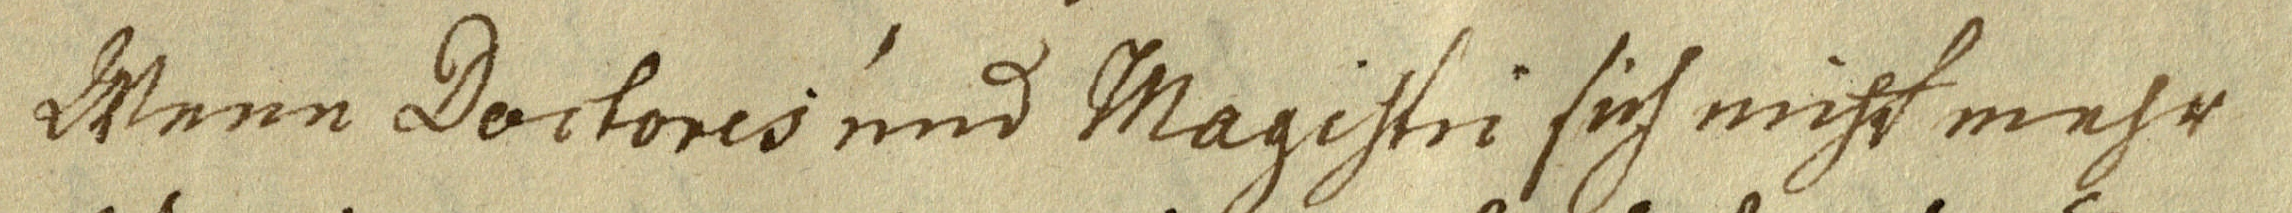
Wenn Doctores und Magistri sich nicht mehr
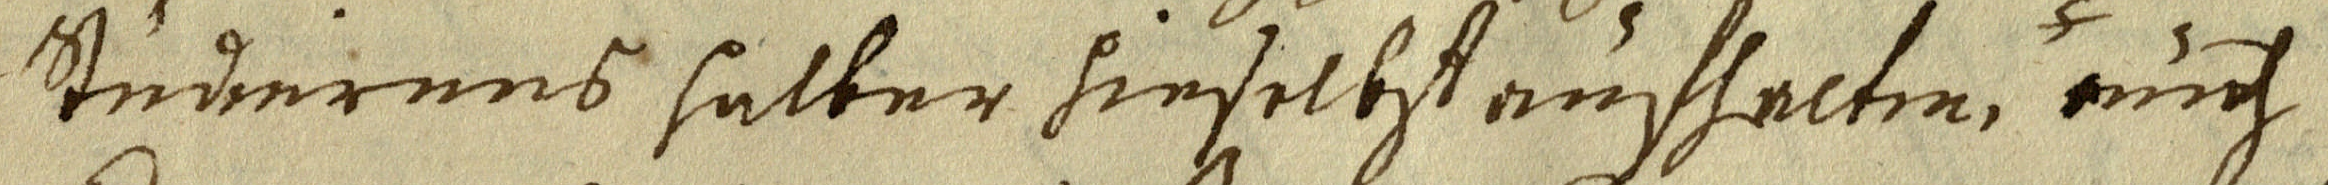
Studierens halber hieselbst aufhalten, auch
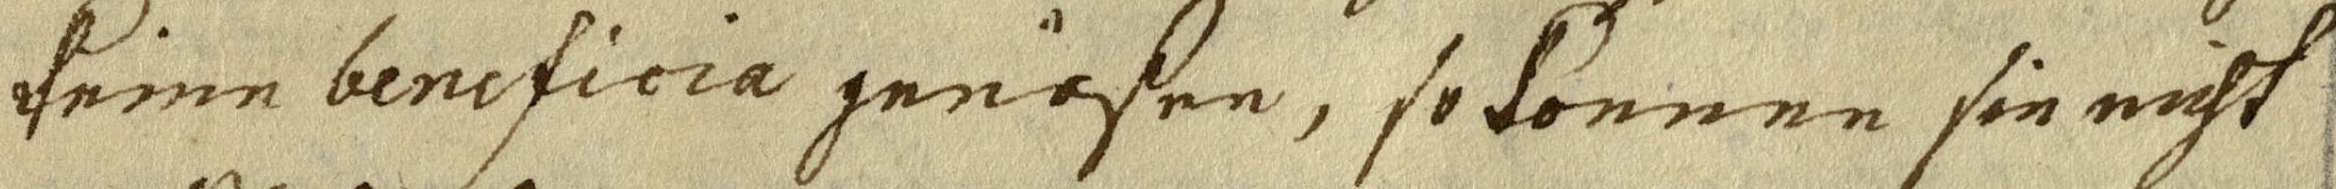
keine beneficia genößen, so konnen sie nicht
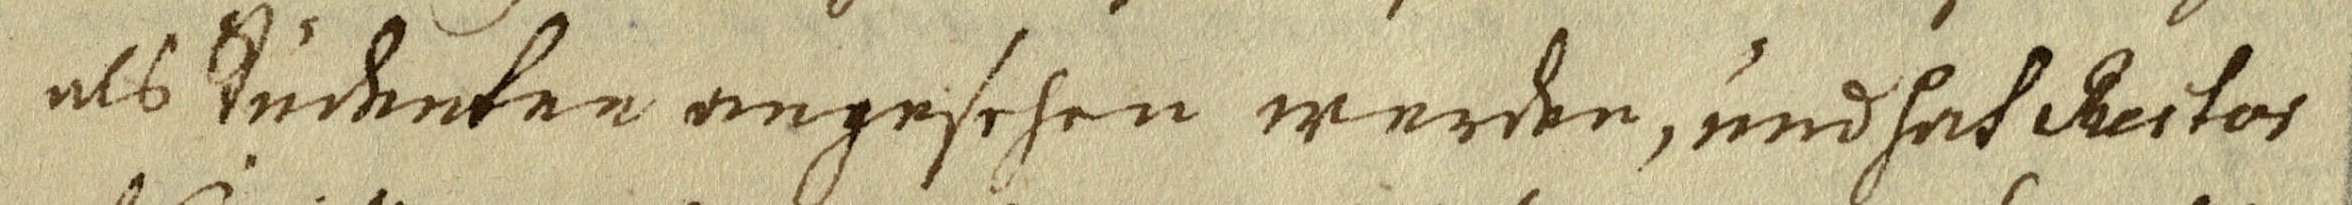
als Studenten angesehen werden, und hat Rector
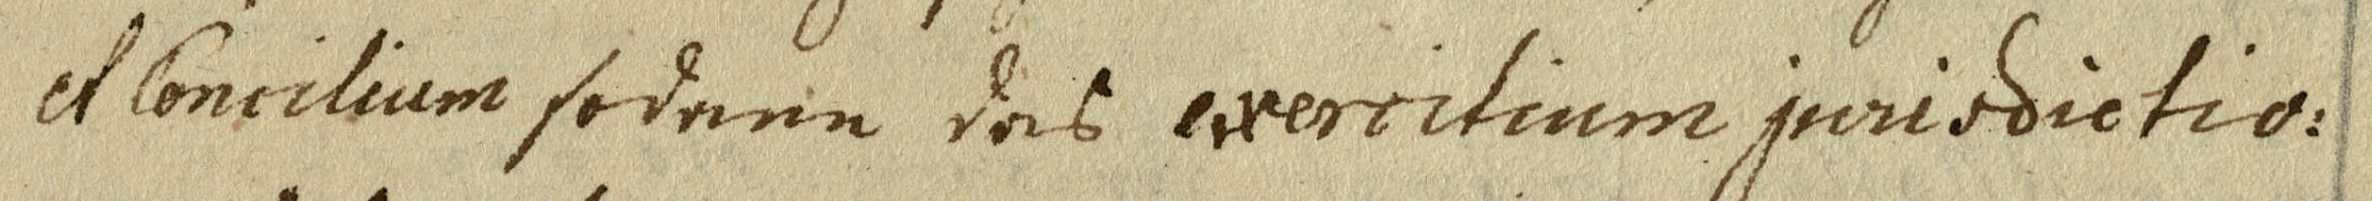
et Concilium sodann das exercitium jurisdictio¬
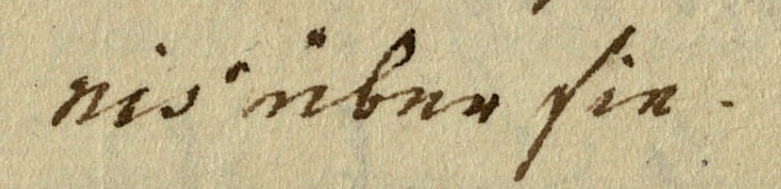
nis über sie.
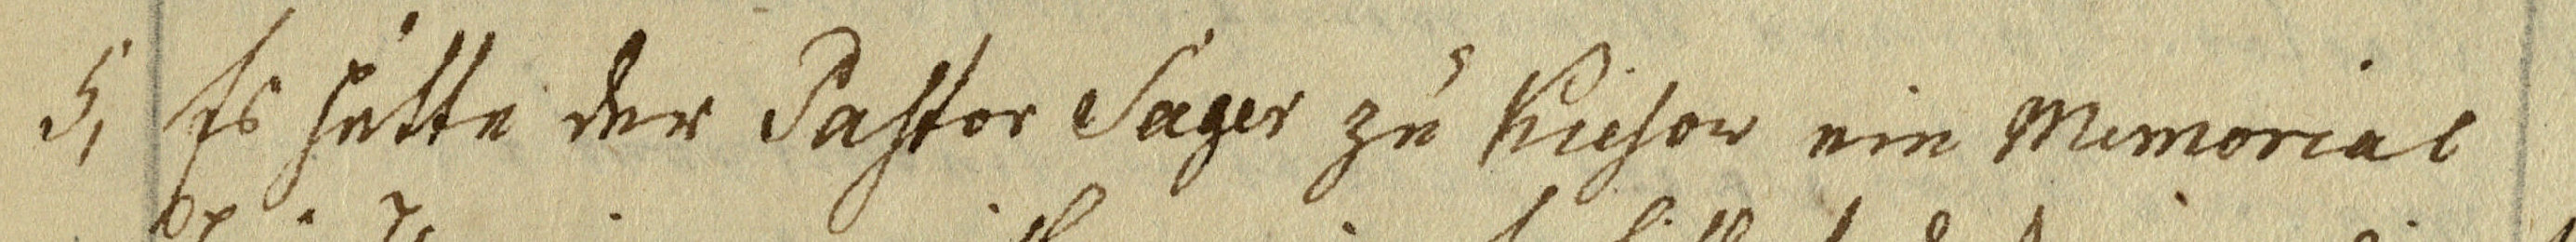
5. Es hätte der Pastor Sager zu Kiesow ein Memorial
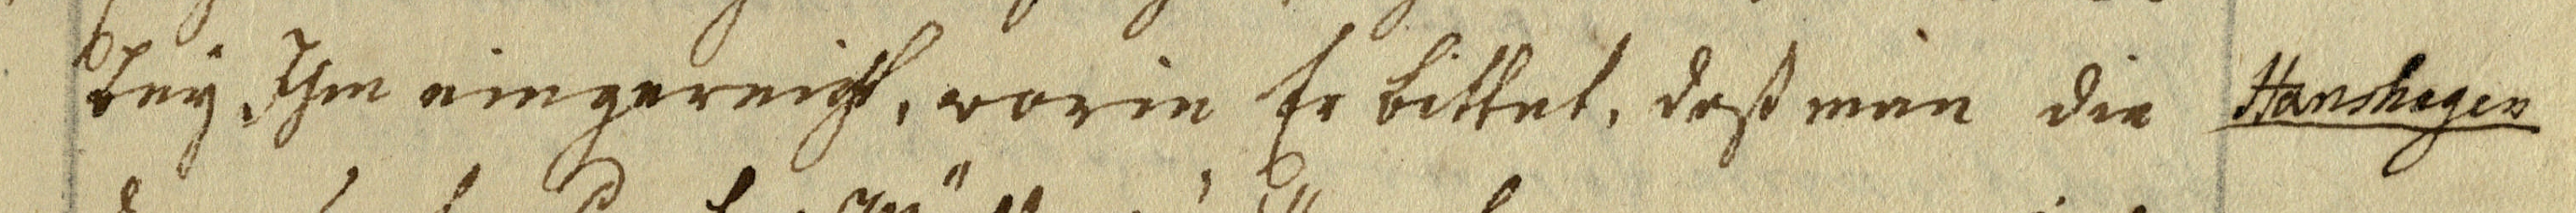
beÿ Ihm eingereicht, worin Er bittet, daß man die Hanshagen
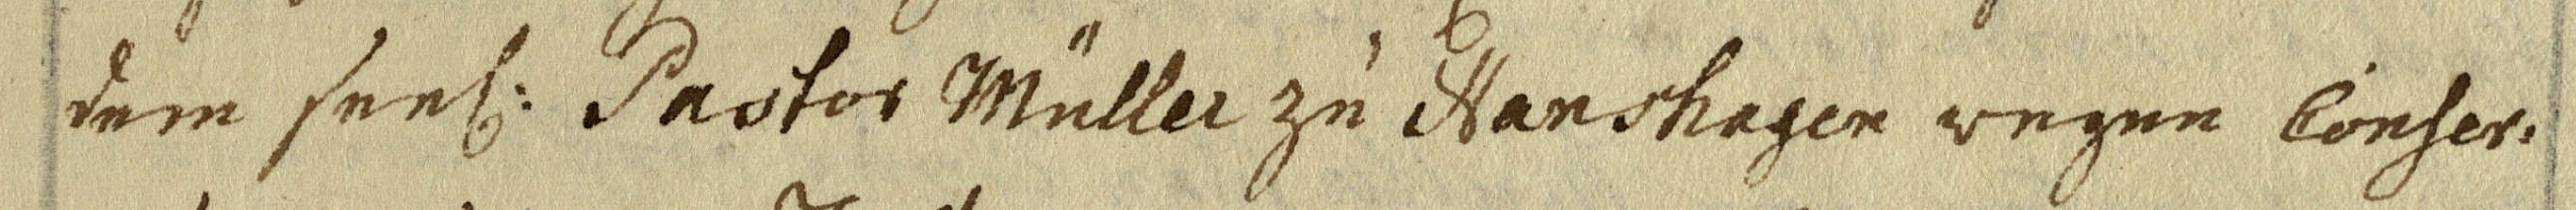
dem seel: Pastor Müller zu Hanshagen wegen Conser¬
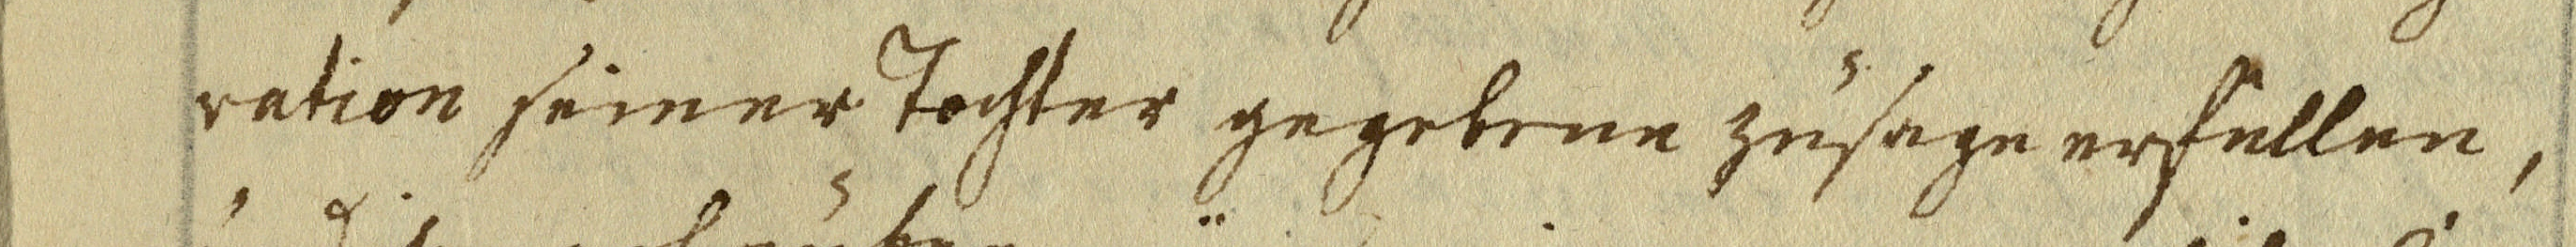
vation seiner Tochter gegebene zusage erfüllen,
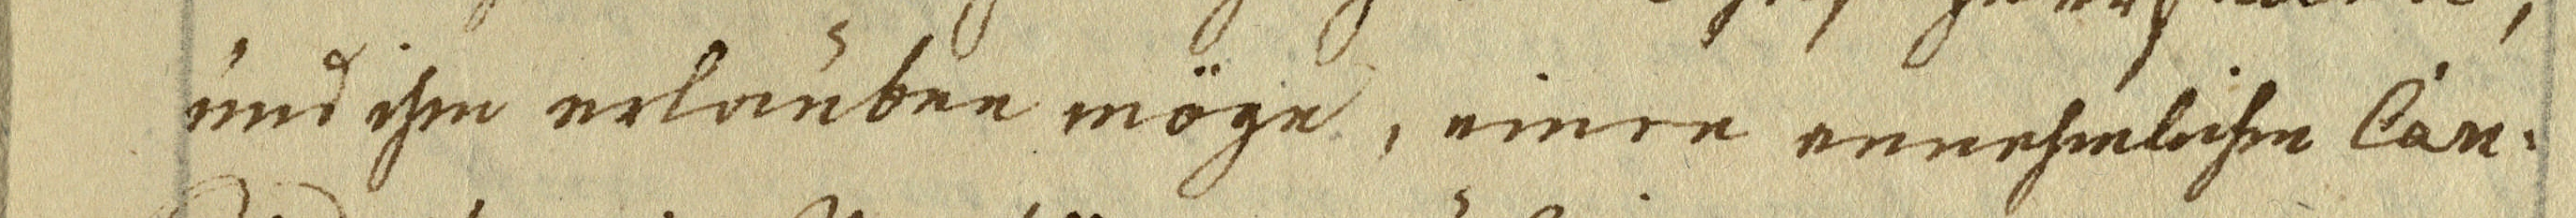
und ihm erlauben möge, einen annnehmlichen Can¬
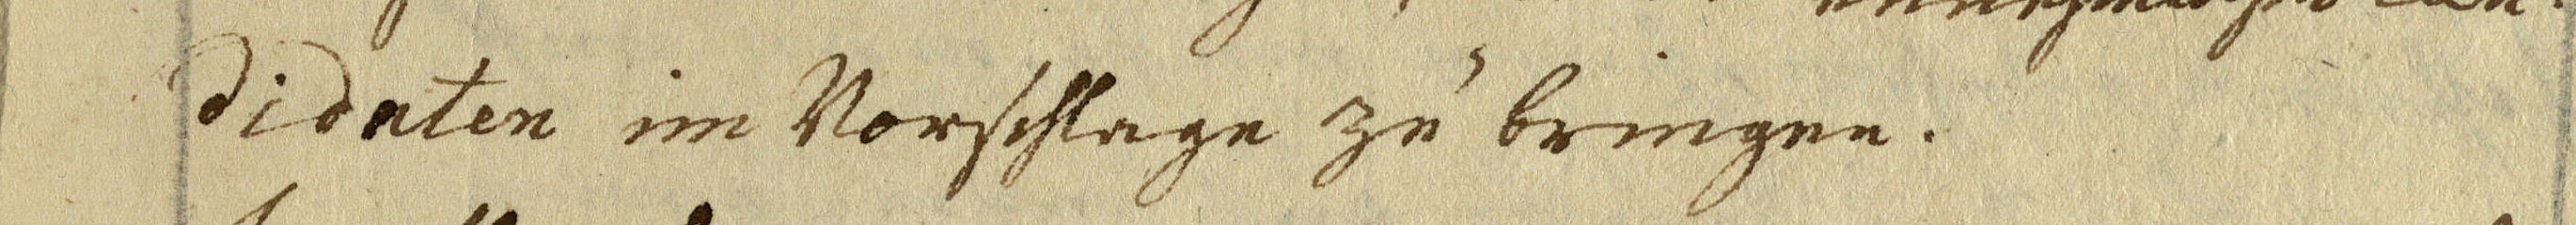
didaten im Vorschlage zu bringen.
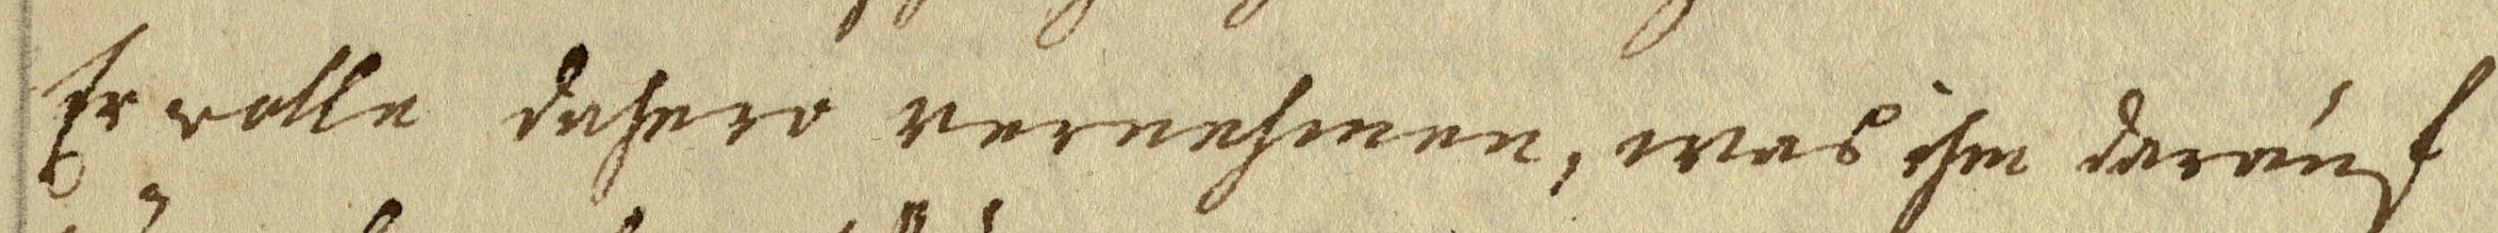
Er wolle dahero vernehmen, was ihm darauf
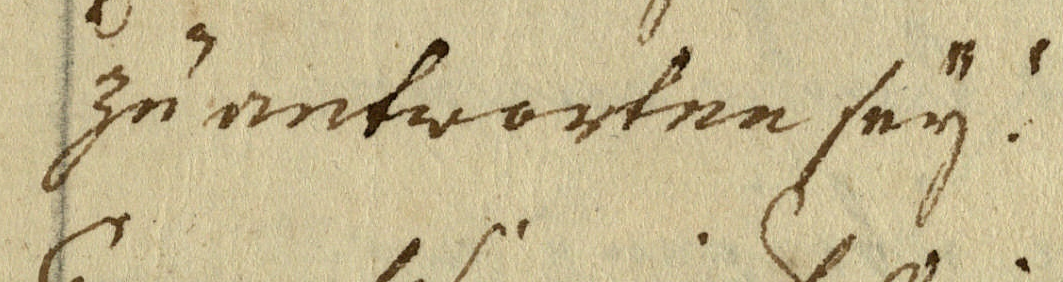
zu antworten seÿ!
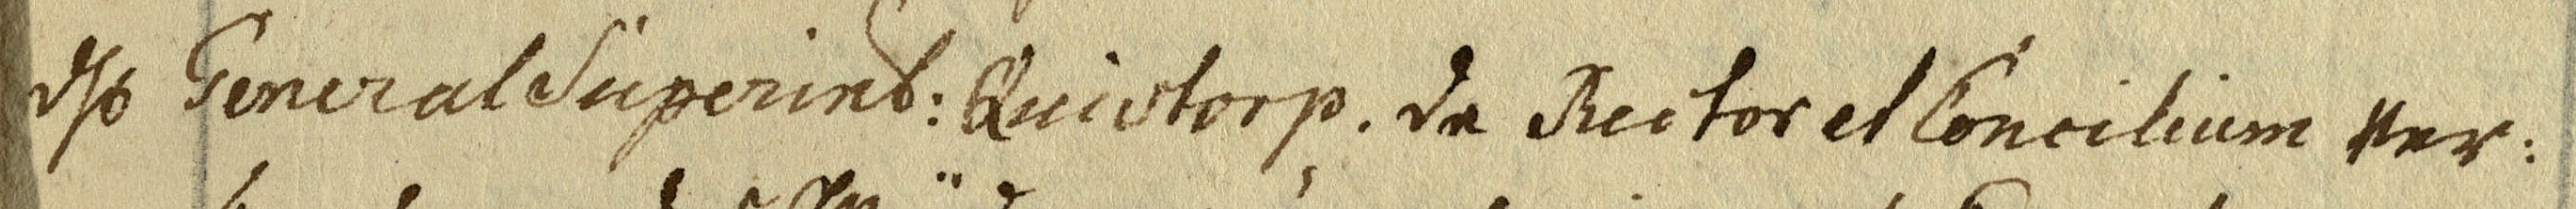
dh GeneralSuperint: Quistorp. da Rector et Concilium ver¬
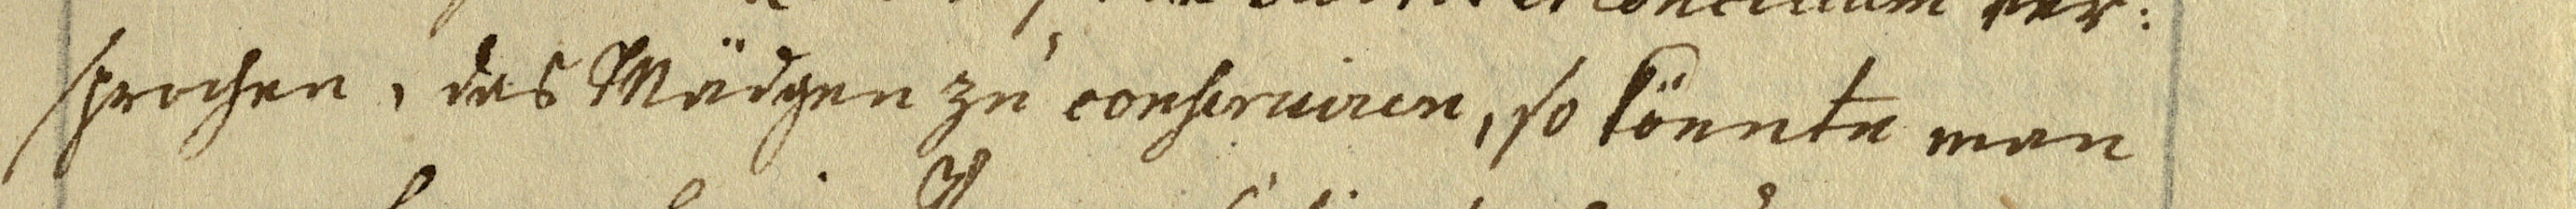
sprochen, das Mädgen zu conserviren, so könnte man
